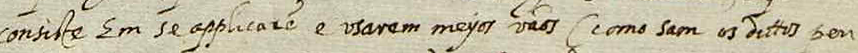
consiste Em se applicarē e vsarem meyos vãos( como sam os dittos pen
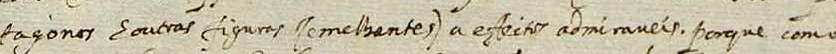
tagonos E outras figuras semelhantes) a effeitos admiraueis. porque como
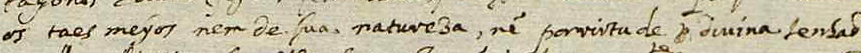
os taes meyos nem de sua natureza, nē por virtude diuina tenhão
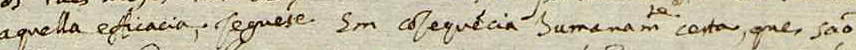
aquella efficacia, seguese Em cōsequēcia humanamte certa, que saõ
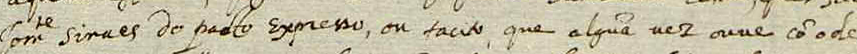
somte sinaes do pacto Expresso, ou tacito, que alguā uez ouue cō o de
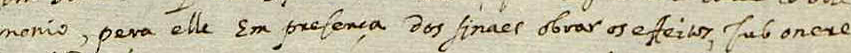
monio, pera elle Em presença dos sinaes obrar os effeitos, sub onere
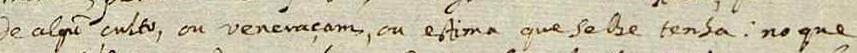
de algū culto, ou veneraçam, ou estima que se lhe tenha : no que
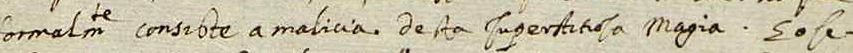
formalmte consiste a malicia desta superstitiosa magia. E o se
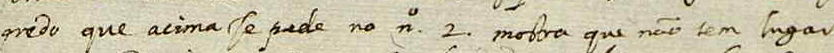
gredo que acima se pede no no. 2. mostra que naõ tem lugar
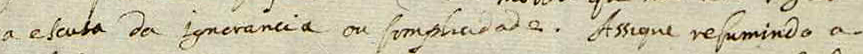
a escusa da ignorancia ou simplicidade. Assi que resumindo a
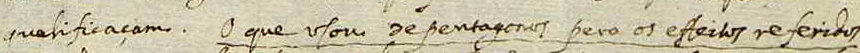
qualificaçam. O que vsou de pentagonos pera os effeitos referidos
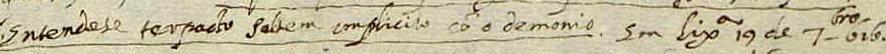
Entendese ter pacto saltem implicito cō o demonio. Em lixa 19 de 7bro 616.
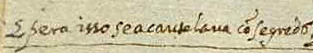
E pera isso se acautelaua cō segredo
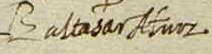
Baltasar Al̄urz
